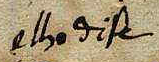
e lho dise
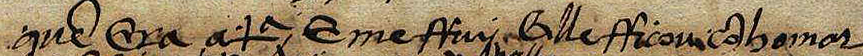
quē Era a ta, E me ffuy Elle fficou cō ho mar
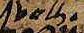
velho
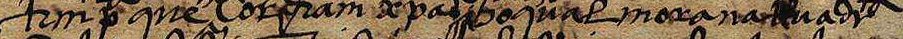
tim pra que he Corgiam xpaõ ho quaL mora na Rua drta
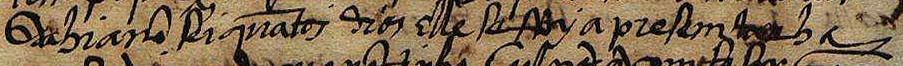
E dahi a nō sei quātos dias Elle se ffoy apresemtar ha
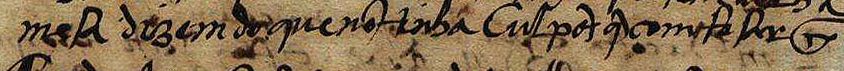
mesa dizemdo que nō tinha Culpas q̄ comfesar c̄ꝭ
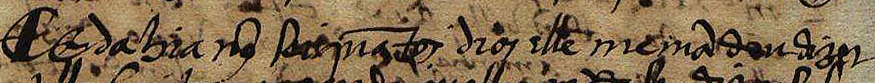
E E dahi a nō sei qūatos dias Elle me mādou dizer
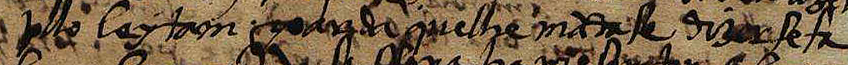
pllo leytam goarda que lhe mādase dizer se fa
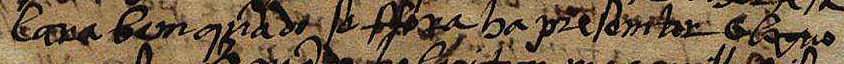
lara bem quādo se ffora hapresemtar E loguo
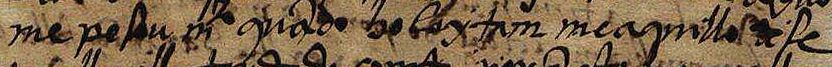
me pesou mto quādo ho leytam me aquillo dise
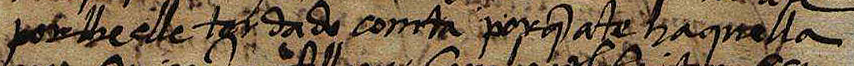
por lhe elle ter dado comta porq̄ ate haquella
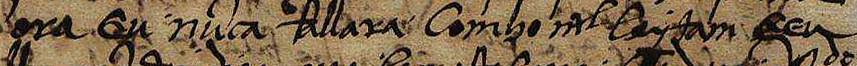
ora Eu nūca fallara Com ho mel leytam E Eu
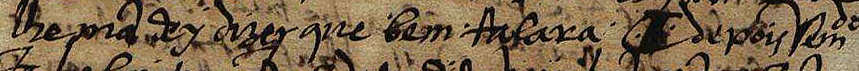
lhe mādey dizer que bem falara E depois Vemdo
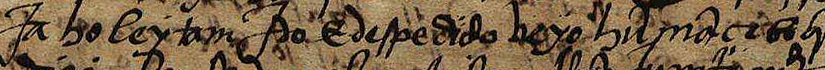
Ja ho leytam Jdo E despedido veyo hū mācebo q̄
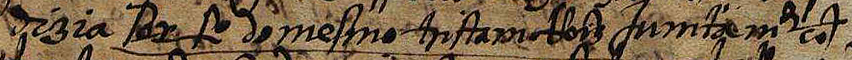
dizia ser fo do mesmo tristam Roiz̄ Jumtamte cō
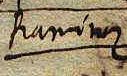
Ramirez
